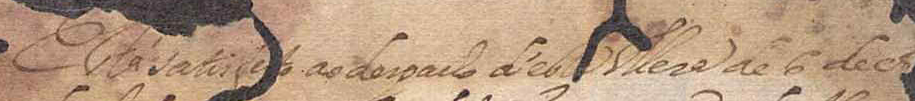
Está satisfeto ao despacho d'est_ Meza de 6 de A
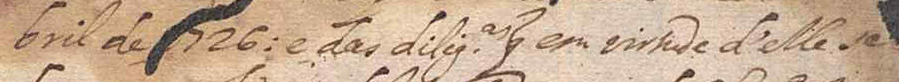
bril de 1726: e das dilig.as q̄ em virtude d'elle se
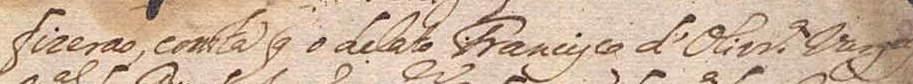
fizeraõ, consta q̄ o delato Francisco d'Olivr.a Vargas
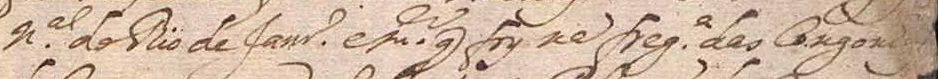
n.al do Rio de Janr.o e m.or q̄ foy na freg.a das Congonhas
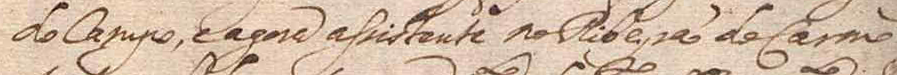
do Campo, e agora assistente no Ribejraõ do Carmo
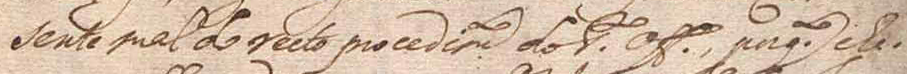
sente mal do recto procedimto do s.to Off.o, porq.to che
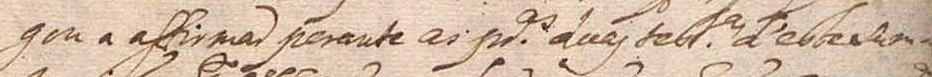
gou a affirmar perante as pr.as duas test.as d'este sum
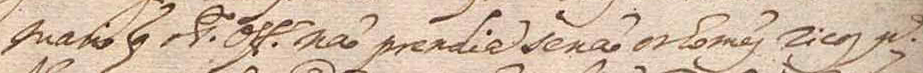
mario q̄ o s.to off.o naõ prendia senaõ os homēs Ricos p.a
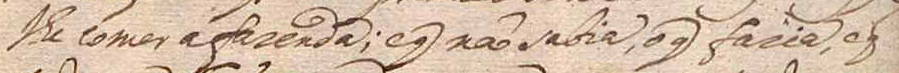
lhe comer a fazenda; e q̄ naõ sabia, o q̄ fazia, e q̄
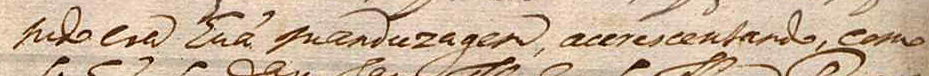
tudo era huā manduzagem, accrescentando, como
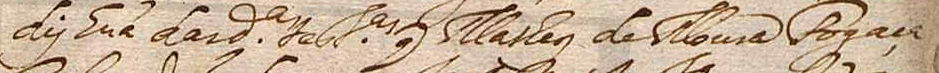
dis huā das d.as test.as q̄ Matheos de Moura Fogaça
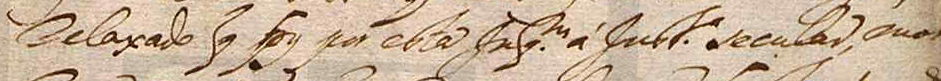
Relaxado q̄ foy por esta Jnq.m á Just.a secular, mor
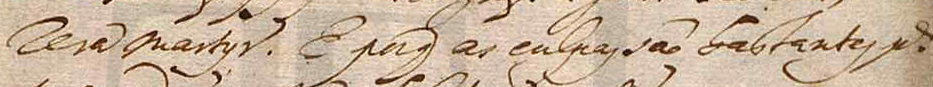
Rera martyr. E porq̄ as culpas saõ bastantes p.a
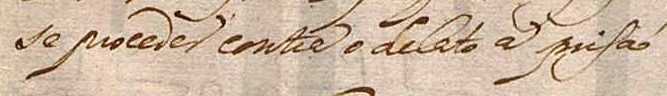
se proceder contra o delato a prisaõ
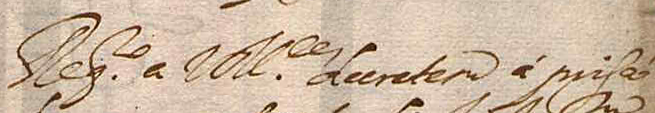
Req.ro a V M.ces decretem á prisaõ
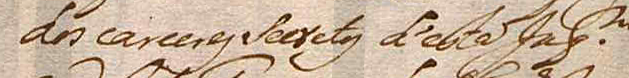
dos carceres secretos d'esta Jnq.m
